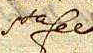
sta fee
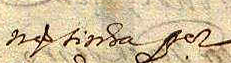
naõ tinha per
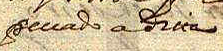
peccado a ditta
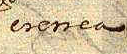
crenca
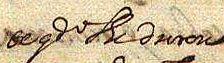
te qdo lhe durou
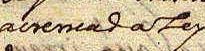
a crenca da Ley
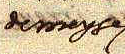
de moyses
